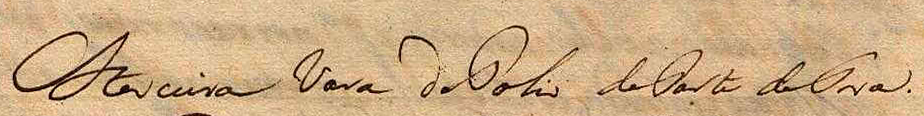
A terceira Vara do Palio de Parte de Fora.
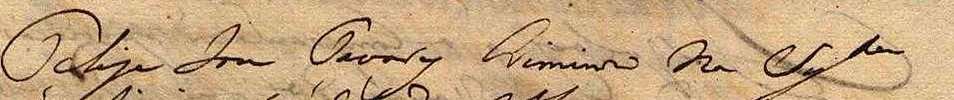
Felipe Ioze Tavares Criminozo na segda
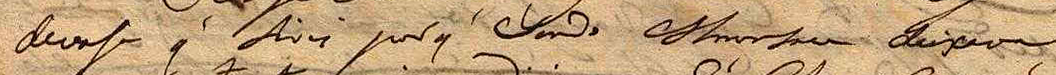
devasa q̄ tirei porq̄ Sendo Almortace deixava,
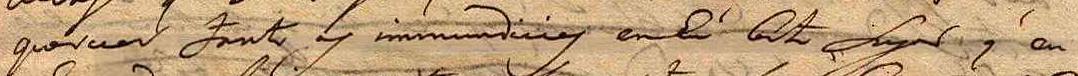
aporuar tanto as immundicias em hū Certo Lugar q̄ en
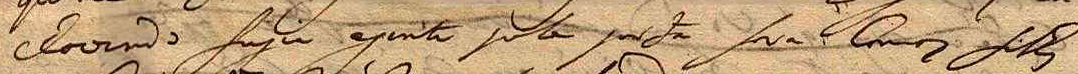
chovendo fugiu a gente pela porta fora Com os filhos
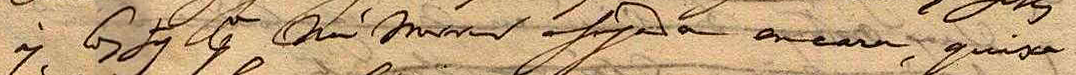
as Costa pa naõ Morrer afogada en caza, queixa
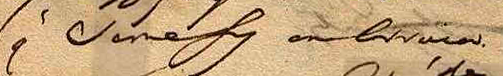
q̄ se me fis en Correria.
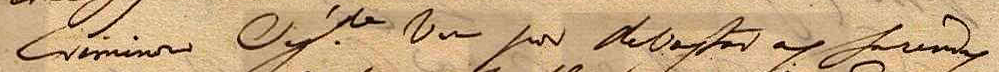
Criminozo Seg.da Vez por devastar as fazendas
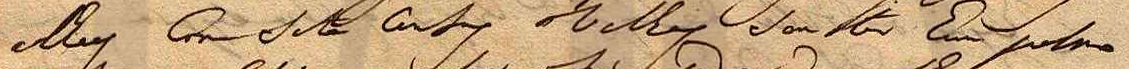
alheas Com setecentas oVelhas sen ter hum palmo
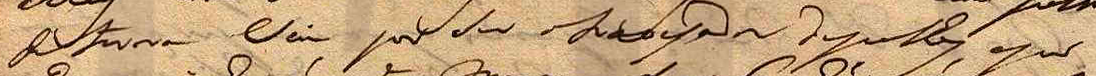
de terra seu, por ser atravesador de pellos, e por
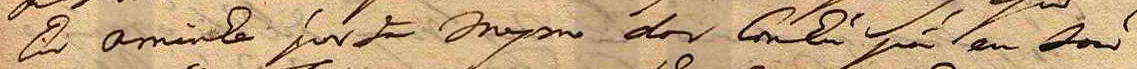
hir a minha porta mesmo dar Con hū pá en Ioaõ
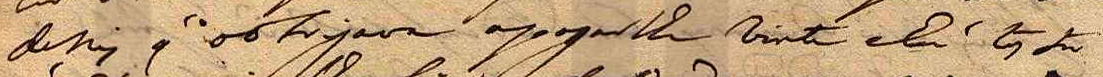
denis q̄ o obrigava a pagarlhe vinte e hū tostaõ
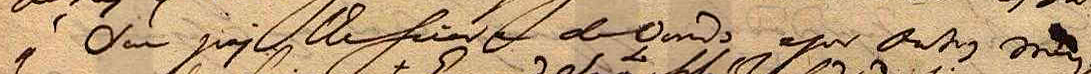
q̄ seu paj lhe ficara devendo e por Outros maes
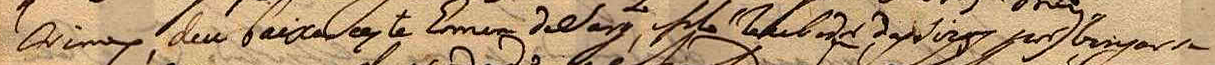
Crimes, deu baixa este homem de Sargto, e fiCo Recebedor das sizas por vingarse
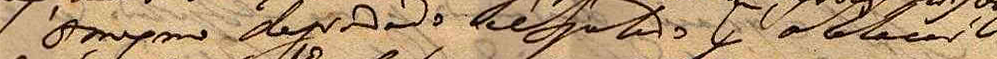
o mesmo degredado e Apelado pa o Relocar
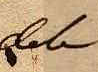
dele
